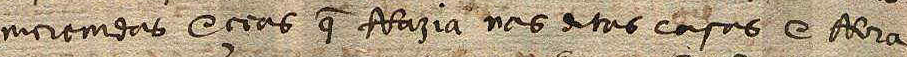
meremdas e çeas q̄ ffazia nas ditas casas e ffora
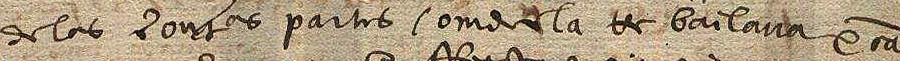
delas ē outas partes / omde ela Re bailaua e c̄a
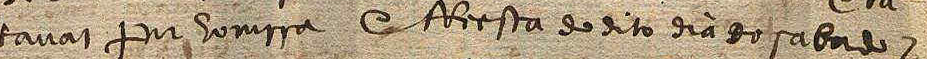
taua / por homrra e ffeesta do dito dia do sabado /
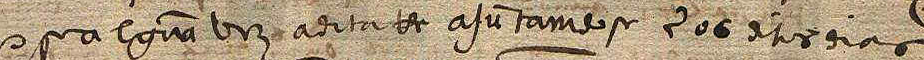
e se algūa vez a dita Re aJūtamdose ē os ditos dias
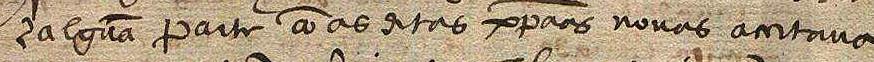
ē algūa parte c̄o as ditas x̄paas nouas açertaua
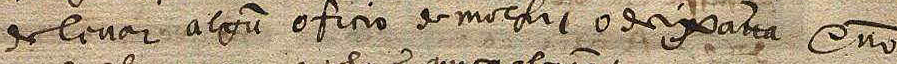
de leuar algū oficio de molher / o deixaua e n̄o
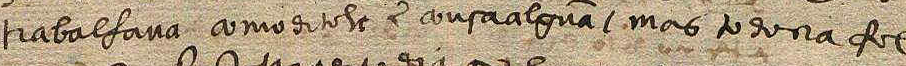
trabalhaua como dito he em cousa alguā / mas todo era fol
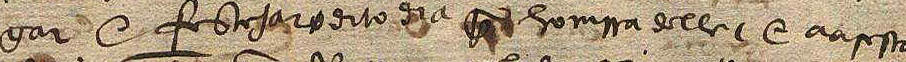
gar e festeJar o dito dia p̄o homrra delle / e aa sesta
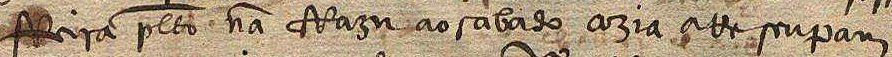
ffeira p̄llo nā ffazer ao sabado cozia a Re seu pam
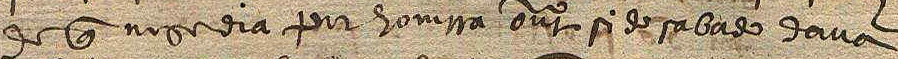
de que nese dia por homrra outro si do sabado daua
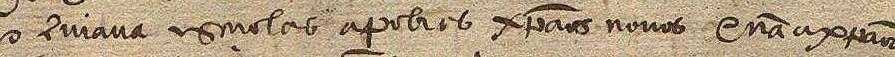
e ēuiaua esmolas a pobres xpãos nouos e nā a xpãos
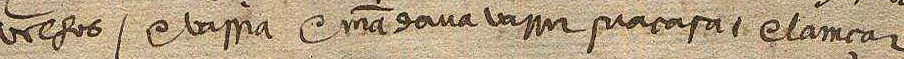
velhos / e varria e mādaua varrer sua casa / e lamçar
